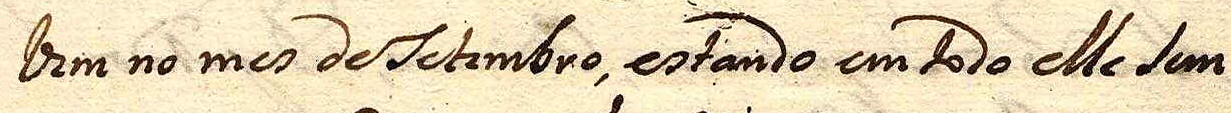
Vem no mes de Setembro, estando em todo elle sem
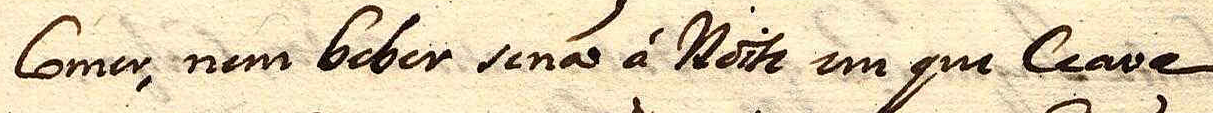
Comer, nem beber senão á Noite em que Ceava
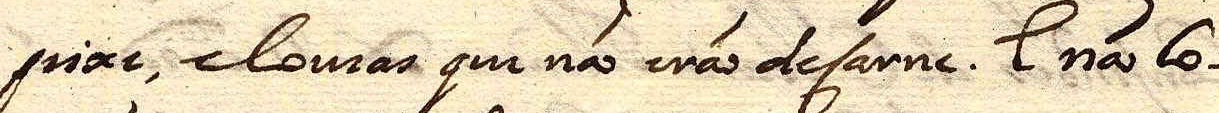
peixe, e Couzas que não erão de Carne. E não Co
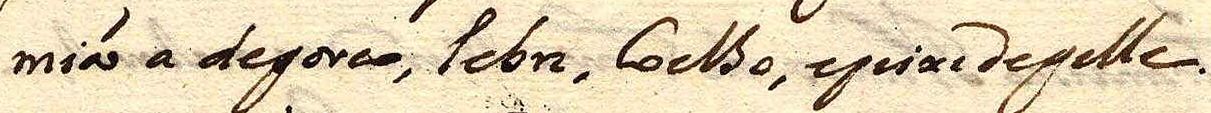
mião a de porco, lebre, Coelho, e peixe de pelle.
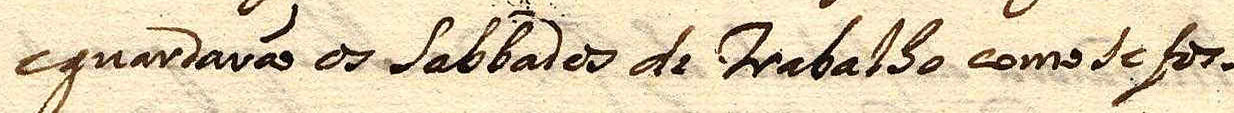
e guardavão os Sabbados de Trabalho como se fos
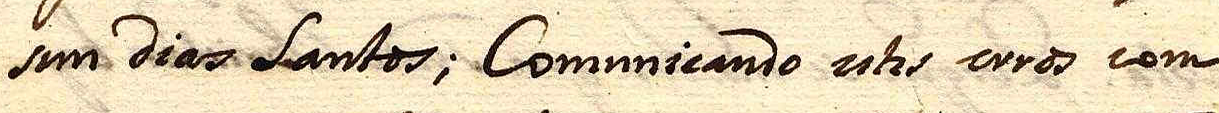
sem dias Santos; Comunicando estes erros com
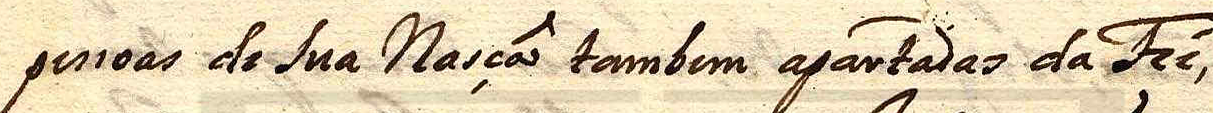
pessoas de Sua Nasção tambem apartadas da Feé,
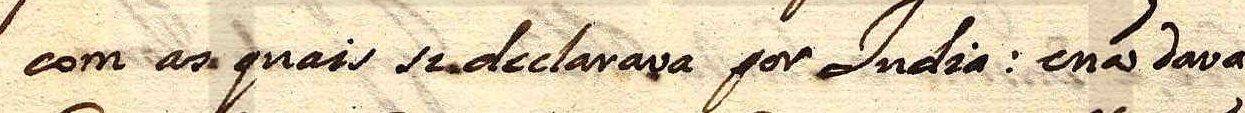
com as quais se declarava por Iudia: e não dava
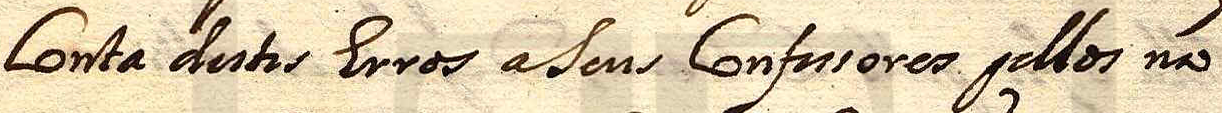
Conta destes Erros a Seus Confessores pellos não
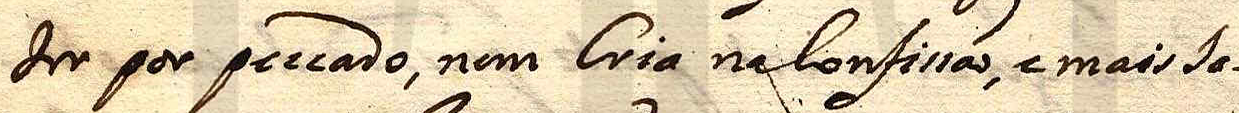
ter por peccado, nem Cria na Confissão, e mais Sa
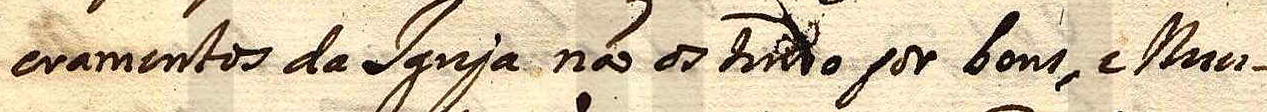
cramentos da Igreja não os tendo por bons, e Neces
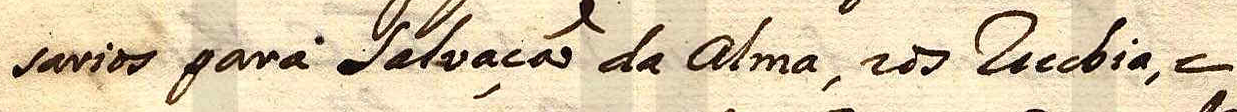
sarios para Salvaçaõ da alma, e os Recebia, e
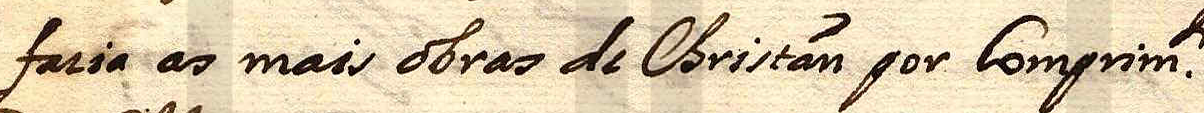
fazia as mais obras de Christān por Comprim.to
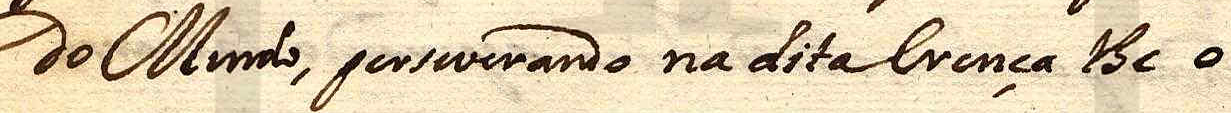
do Mundo, perseverando na dita Crença the o
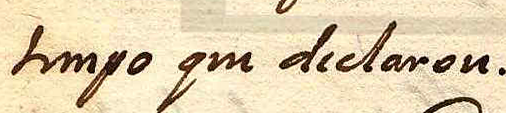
tempo que declarou.
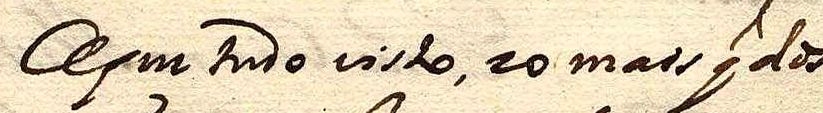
O que tudo visto, e o mais q̄ dos
